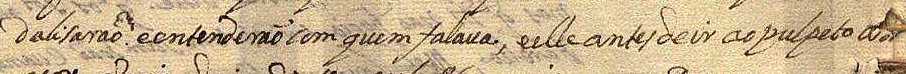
dalisaraõ e entenderaõ com quem falaua, e elle antes de ir ao pulpeto
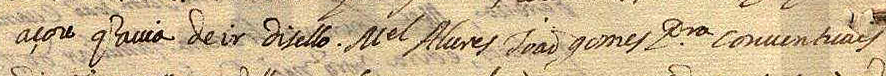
açou q̄ auia de ir disello. Mel Alures Ioaõ gomes P.ra conuentuaes
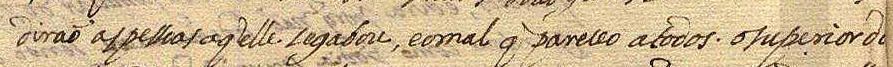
diraõ as pessoas a q̄ elle se gabou, e o mal q̄ pareceo a todos. o superior do
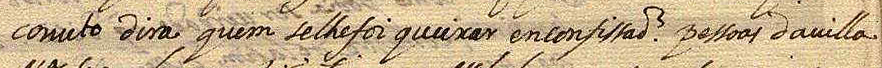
conuto dira quem se lhe foi queixar en confissaõ. pessoas da uilla
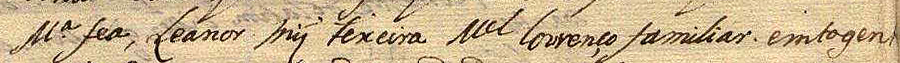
M.a fea, Leanor Miz̄ texeira Mel lourenço familiar e mta gen
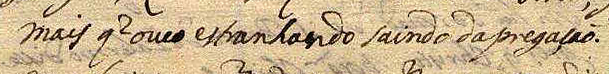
mais q̄ o ueo estranhando saindo da pregasaõ.
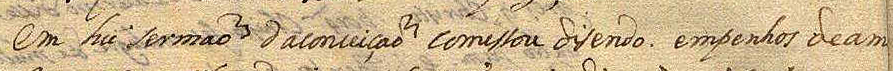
Em hū sermaõ da conceiçaõ comessou disendo empenhos de am
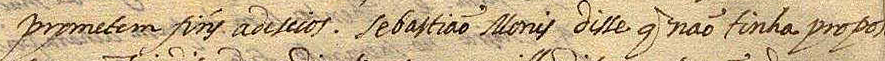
prometera fins a deseios. sebastiaõ Monis disse q̄ naõ tinha propos
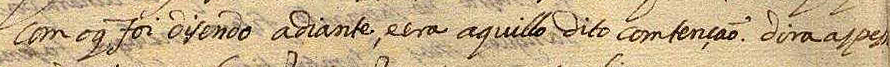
com o q̄ foi disendo adiante, e era aquillo dito com tençaõ. dira as pess
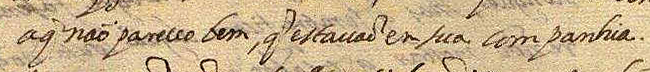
a q̄ naõ pareceo bem, q̄ estauaõ em sua companhia.
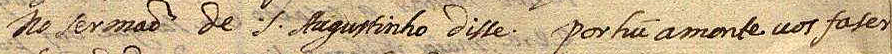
No sermaõ de S. Augustinho disse. por hū amante uos faser
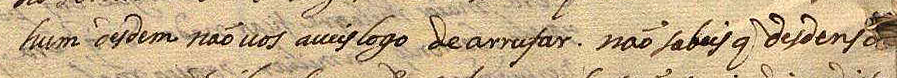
hum desdem naõ uos aueis logo de arrufar. não sabeis q̄ desdens
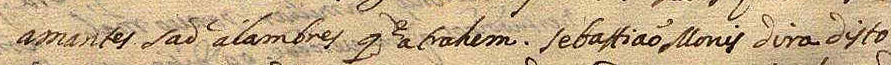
amantes saõ alambres q̄ atrahem. sebastiaõ Monis dira disto
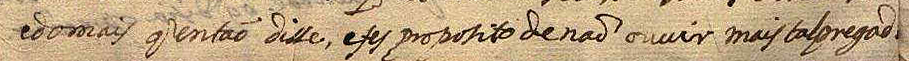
e do mais q̄ entaõ disse, e fes proposito de naõ ouuir mais tal pregad
